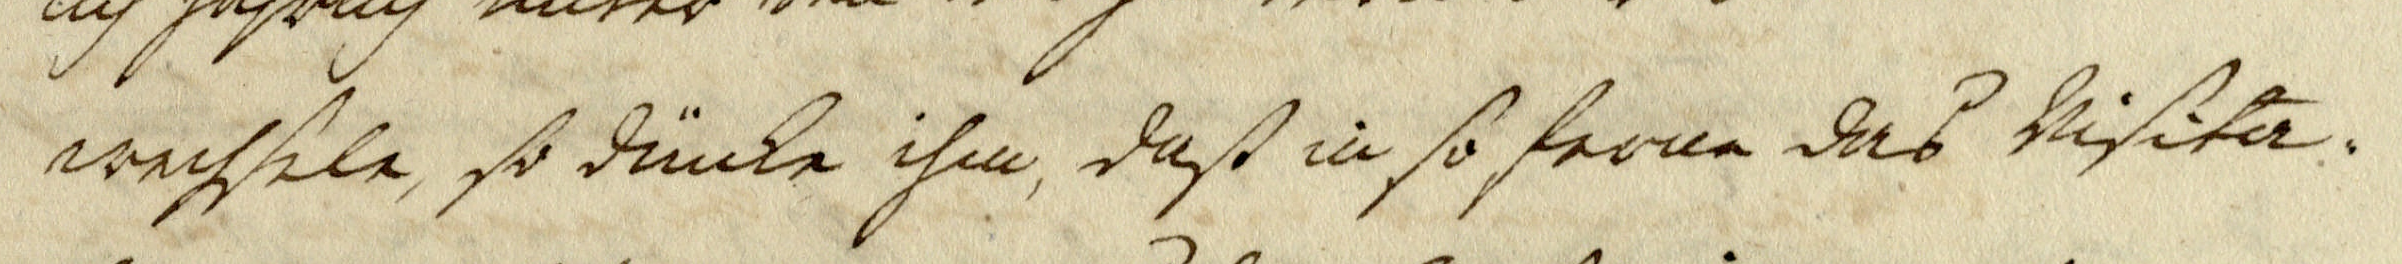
wechsele, so düncke ihm, daß in so ferne das Visita¬
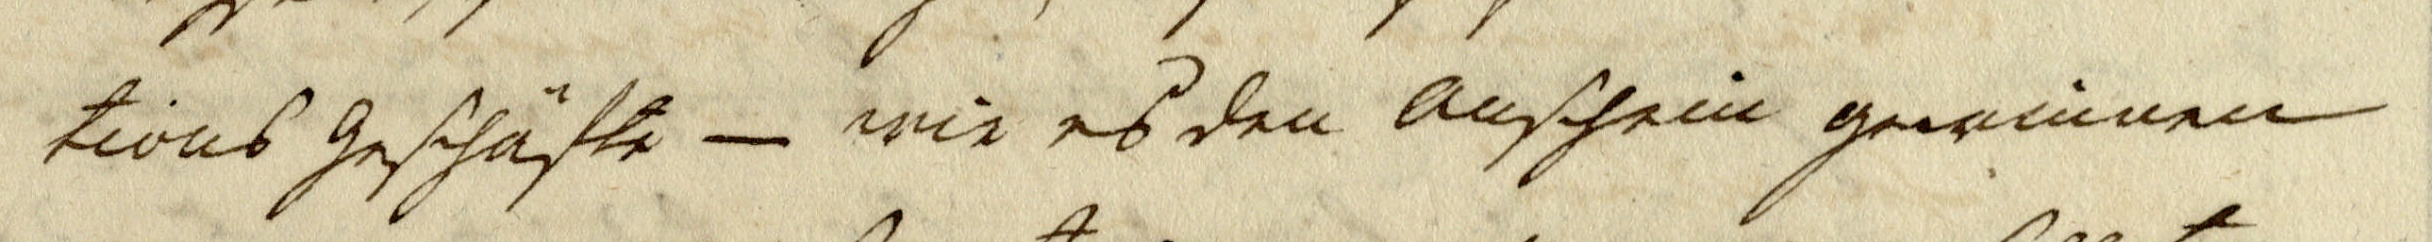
tions Geschäfte wie es den Anschein gewinnen
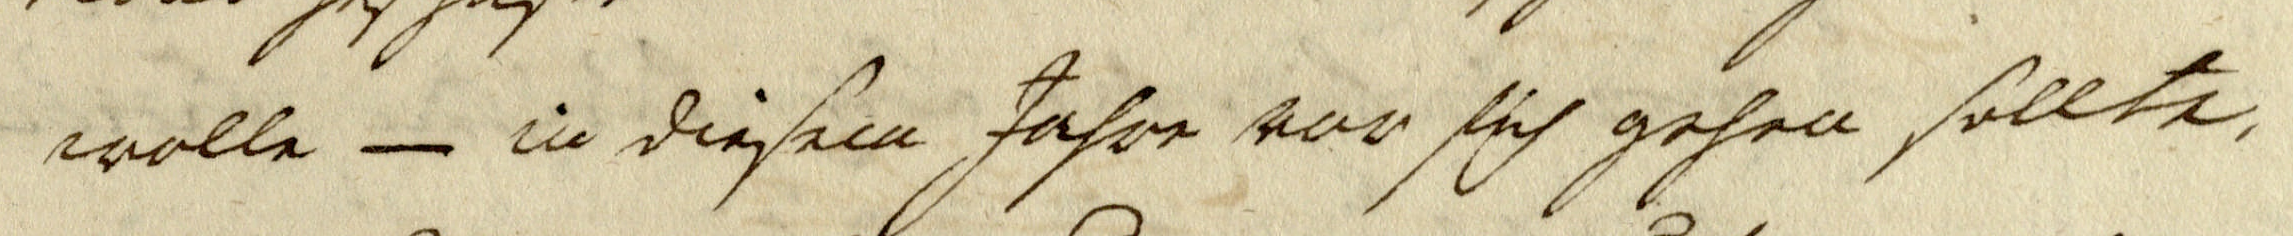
wolle in diesem Jahre vor sich gehen sollte,
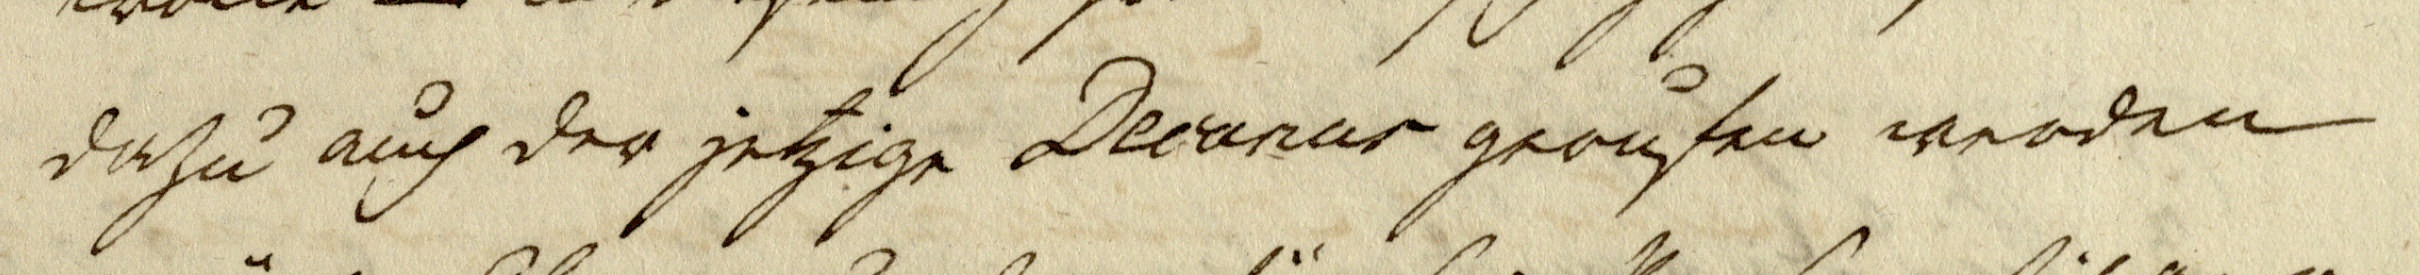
dazu auch der jetzige Decanus gerufen werden
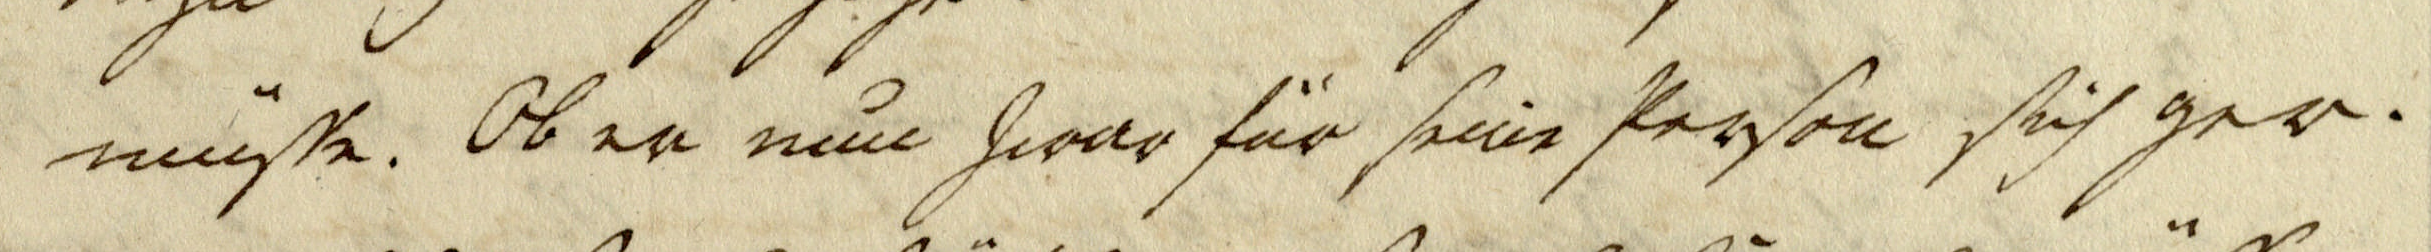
müsse. Ob er nun zwar für seine Person sich ger¬
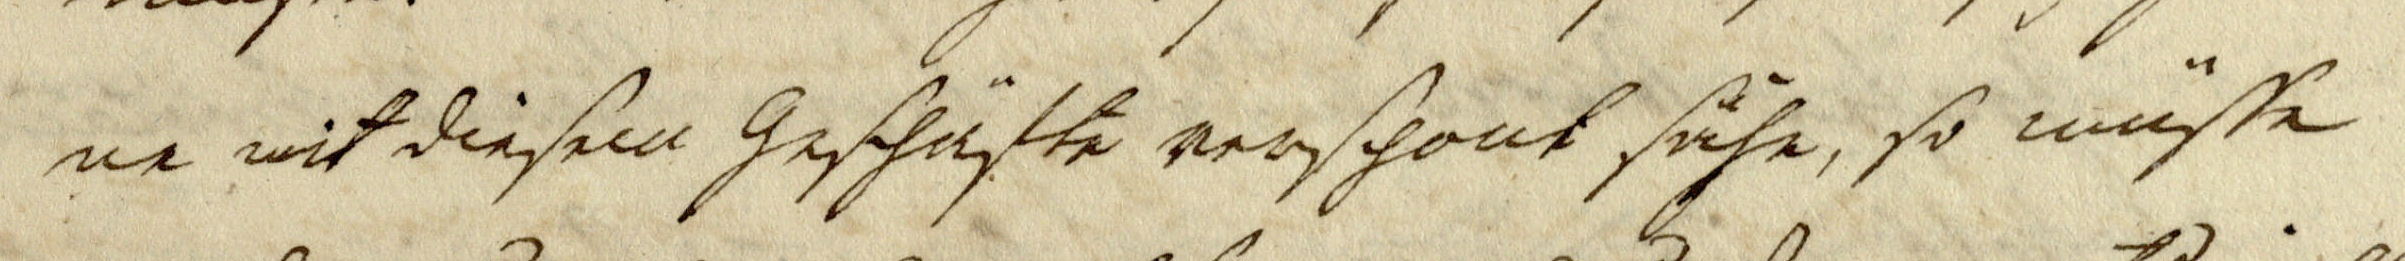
ne mit diesem Geschäfte verschont sähe, so müsse
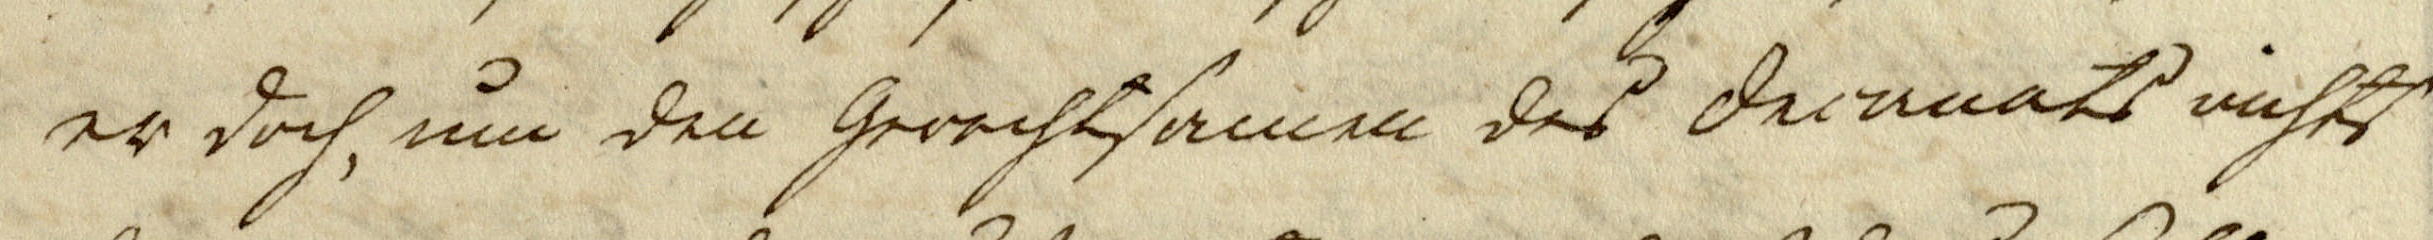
er doch, um den Gerechtsamen des Decanats nichts
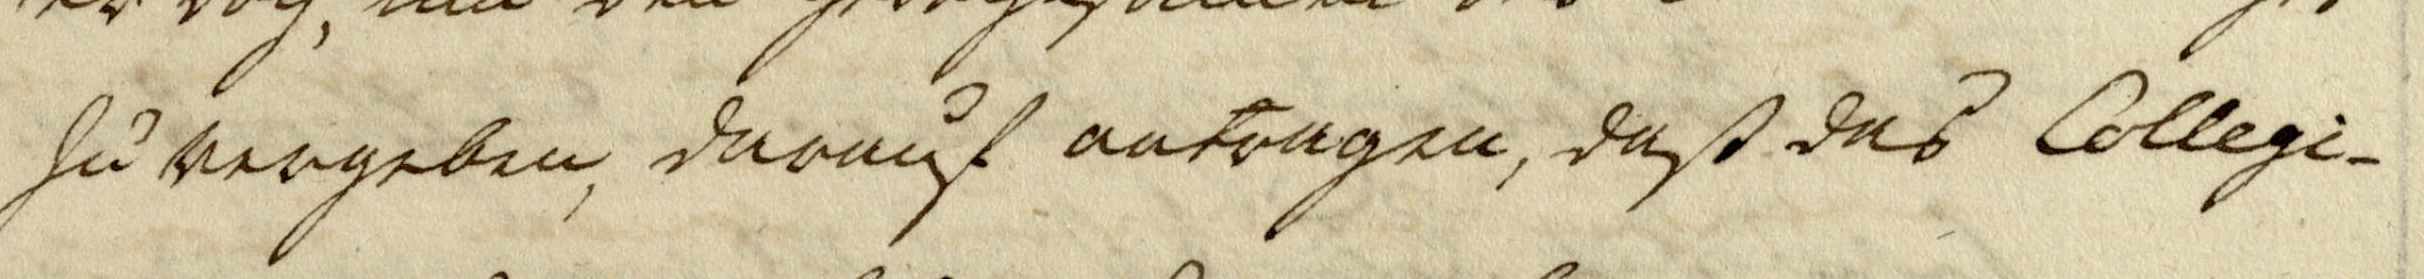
zu vergeben, darauf antragen, daß das Collegi¬
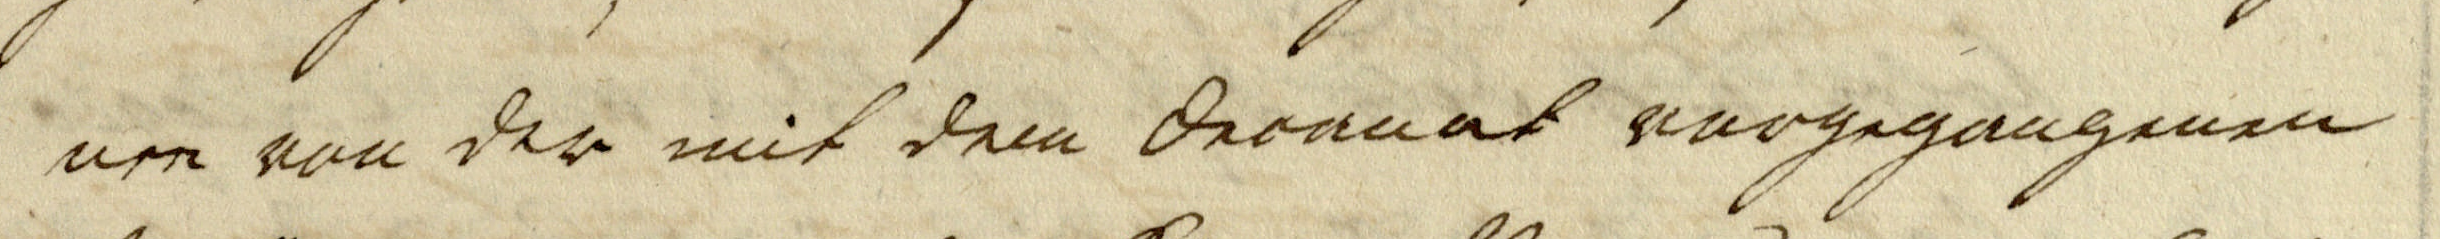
um von der mit dem Decanat vorgegangenen
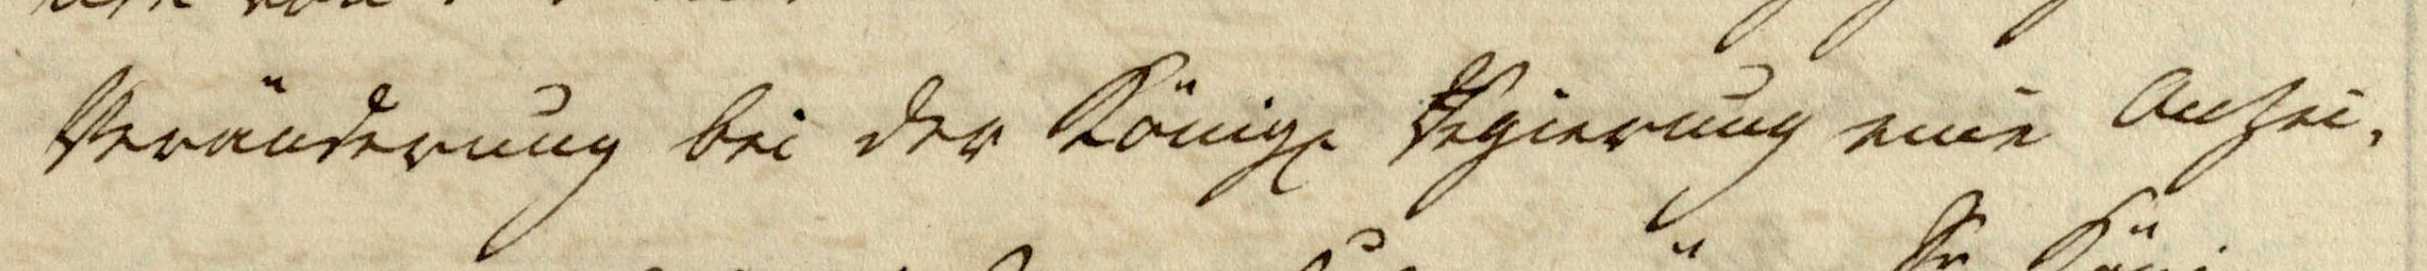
Veränderung bei der Königl. Regierung eine Anzei¬
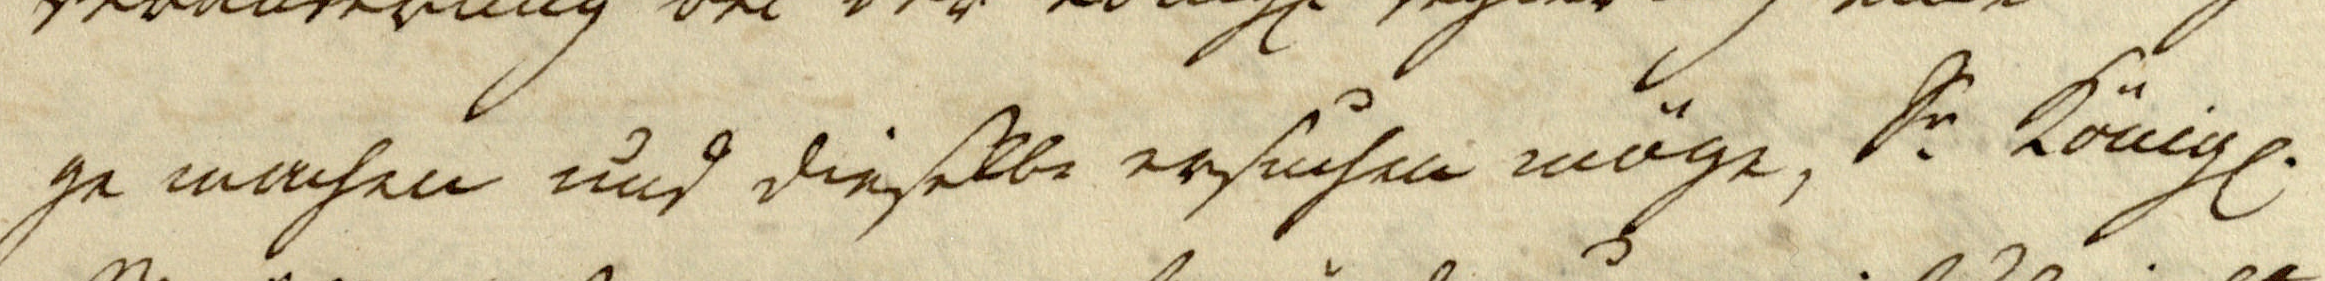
ge machen und dieselbe ersuchen möge, Sr Königl.
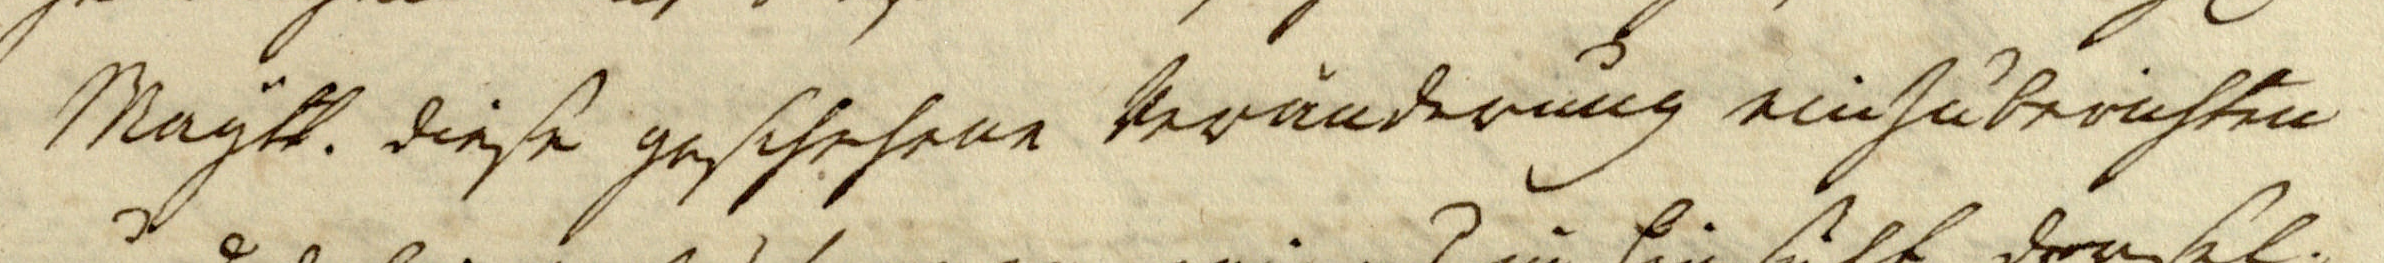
Maÿtt. diese geschehene Veränderung einzuberichten
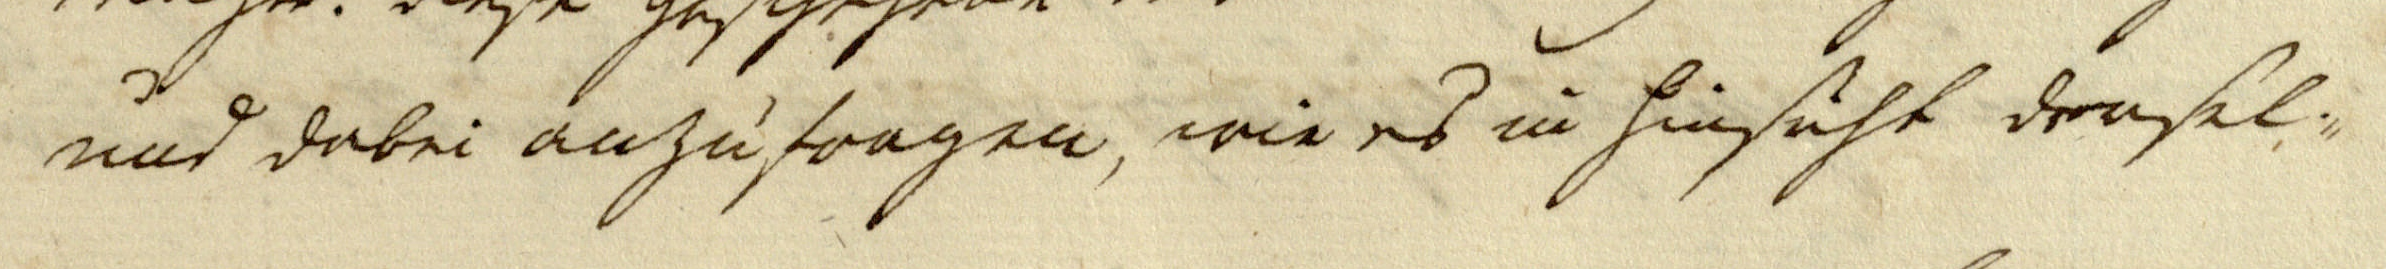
und dabei anzufragen, wie es in Hinsicht dersel¬
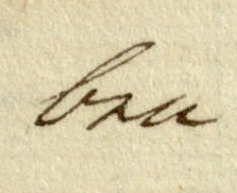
ben
